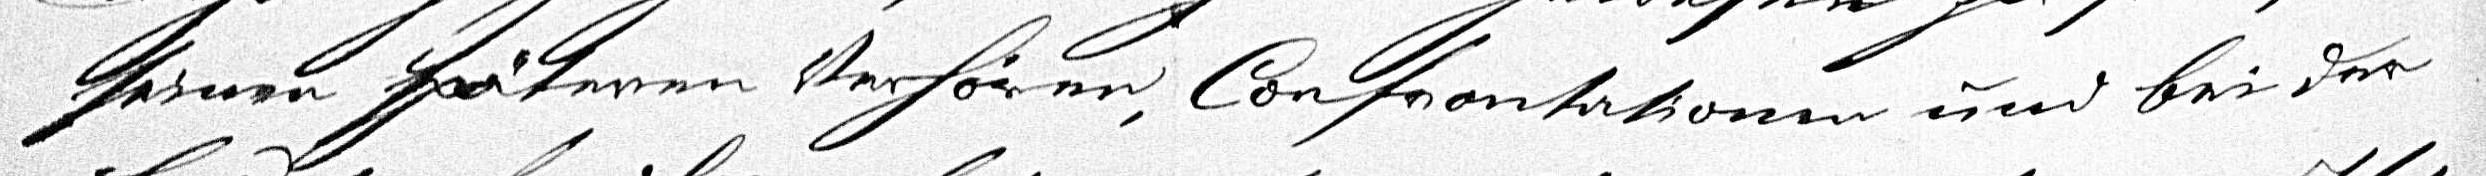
seinem späteren Verhören, Confrontationen und bei der
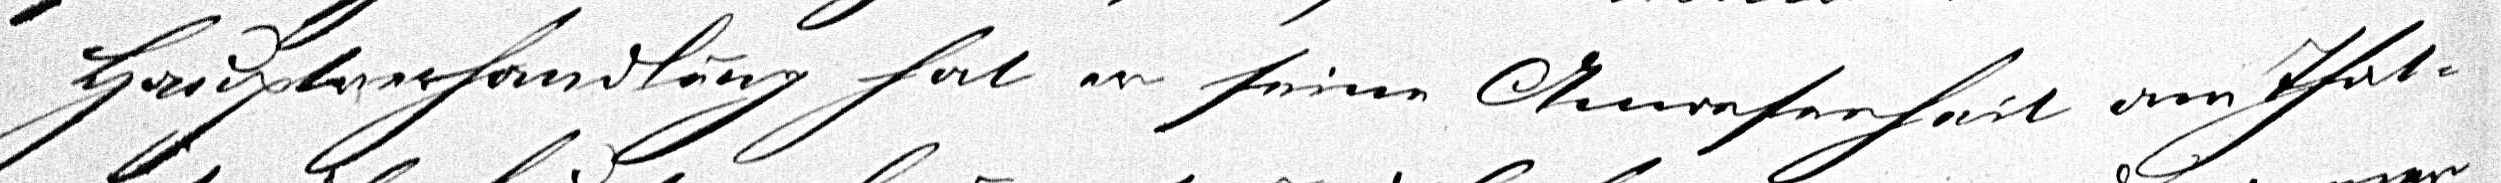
Hauptverhandlung hat er seine Anwesenheit am That¬
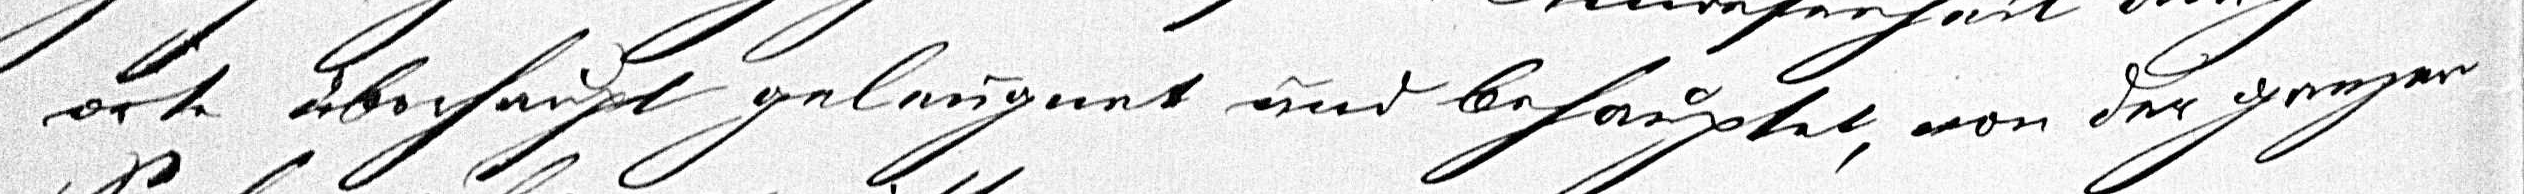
orte überhaupt geleugnet und behauptet, von der ganzen
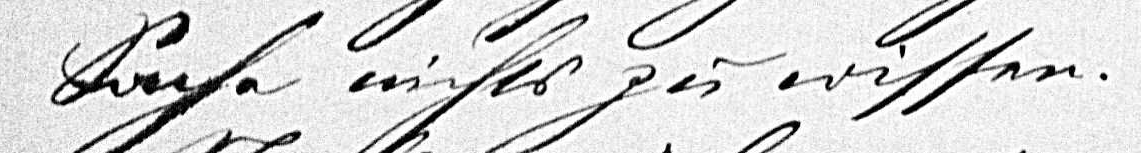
Sache nichts zu wissen.
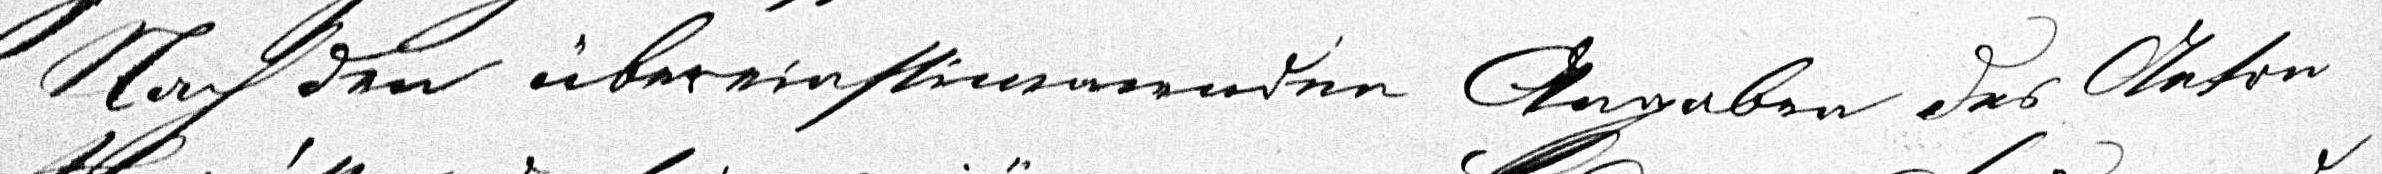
Nach den übereinstimmenden Angaben des Anton
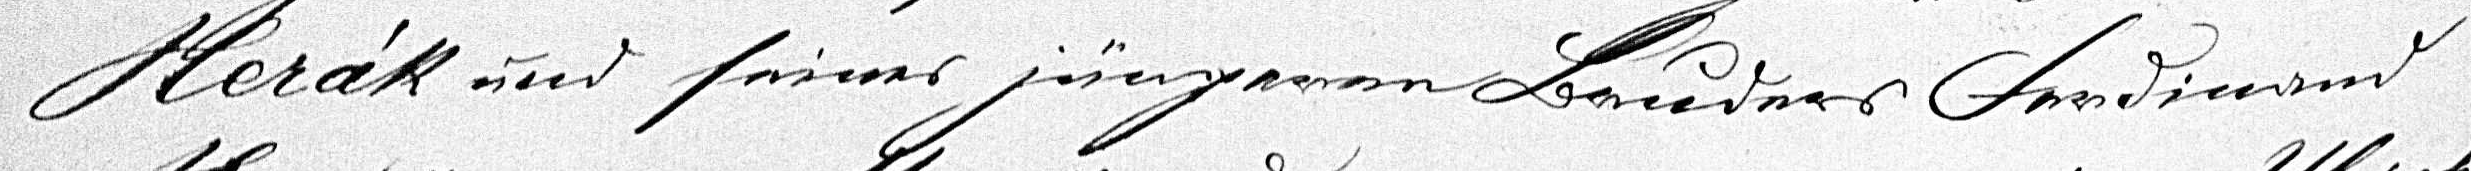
Herák und seiner jüngeren Bruders Ferdinand
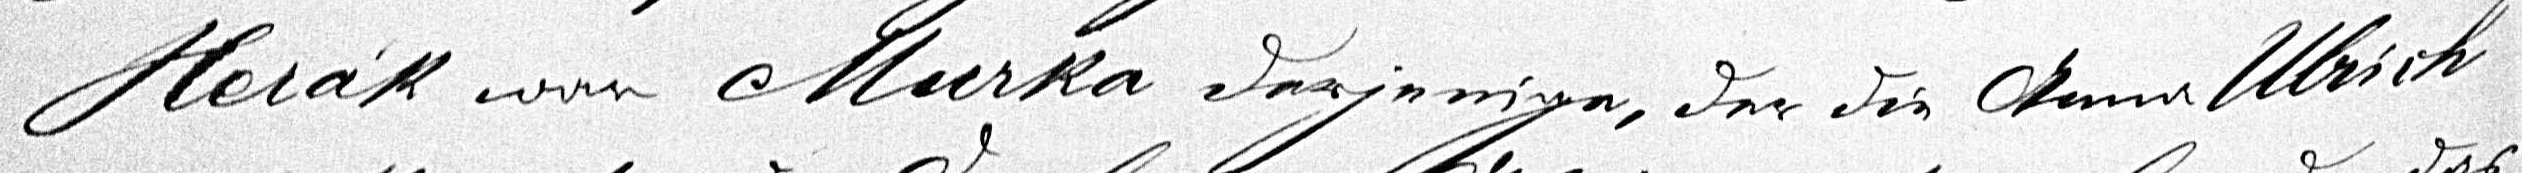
Herák war Murka derjenige, der die Anna Ulrich
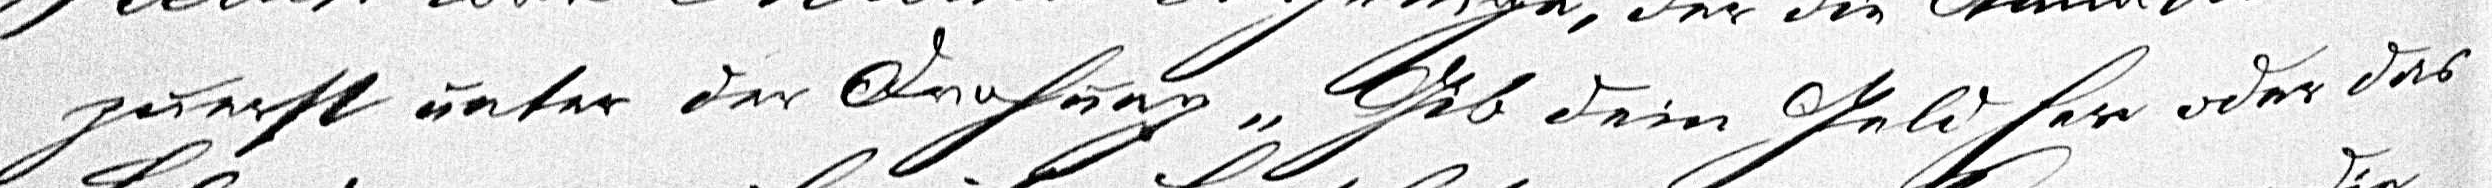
zuerst unter der Drohung „Gib dein Geld her oder das
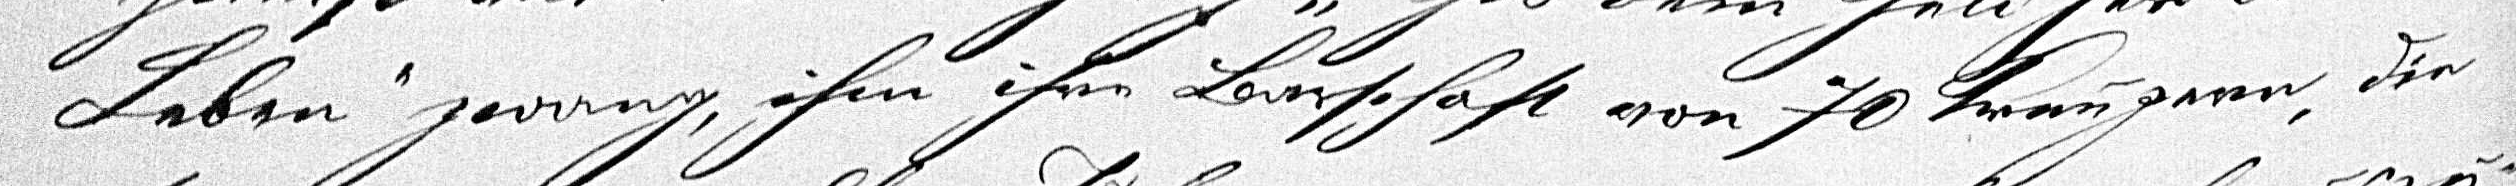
Leben“ zwang, ihm ihre Barschaft von 70 Kreuzer, die
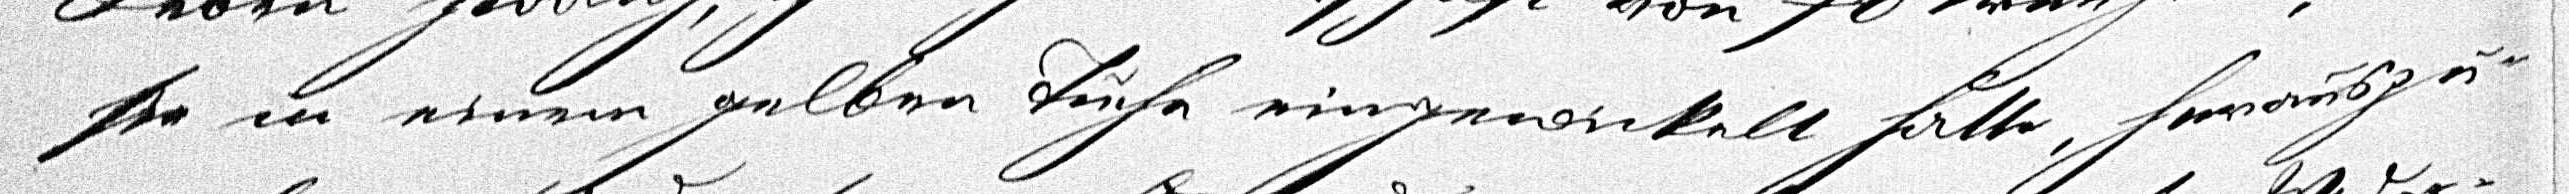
sie in einem gelben Tuche eingewickelt hatte, herauszu¬
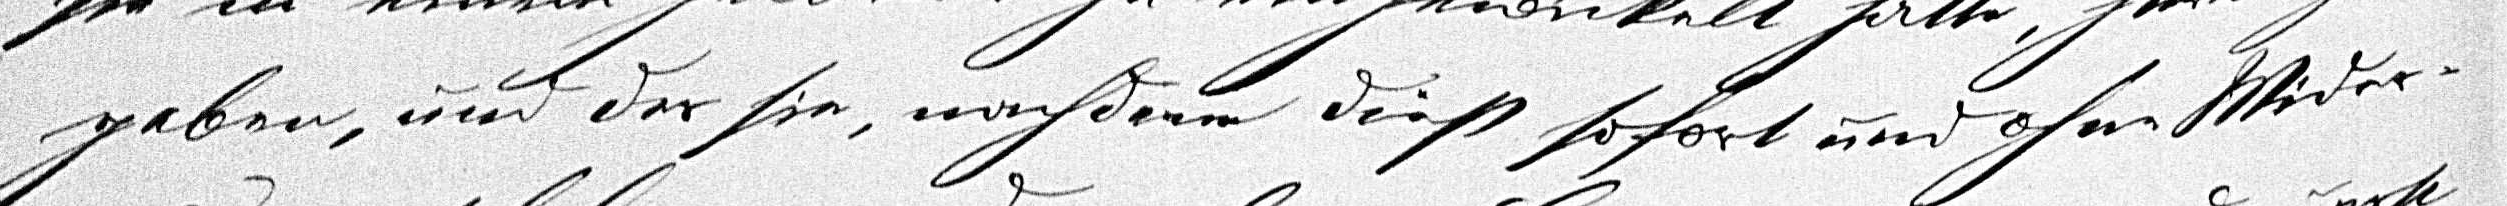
geben, und der sie, nach dem dieß sofort und ohne Wider¬
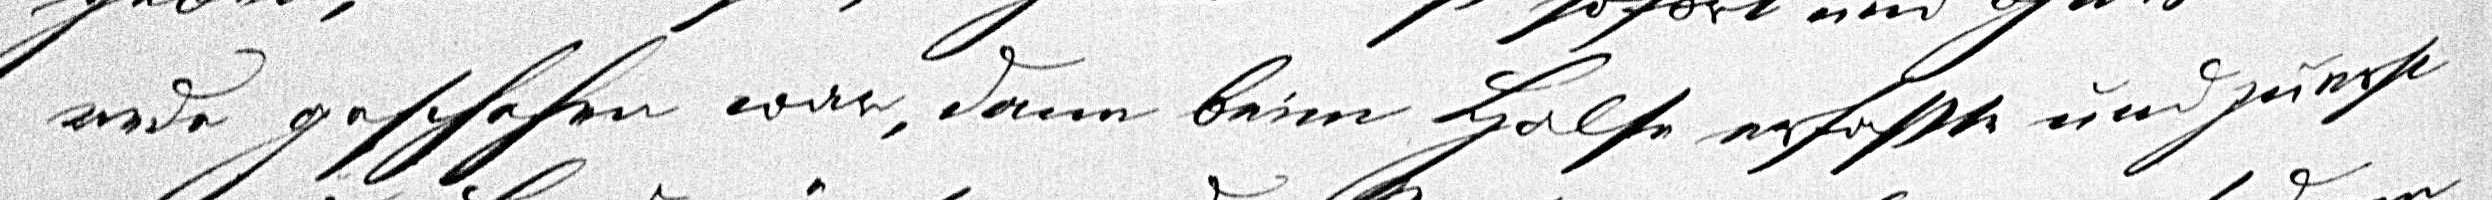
rede geschehen war, dann beim Halse erfaßt und zuerst
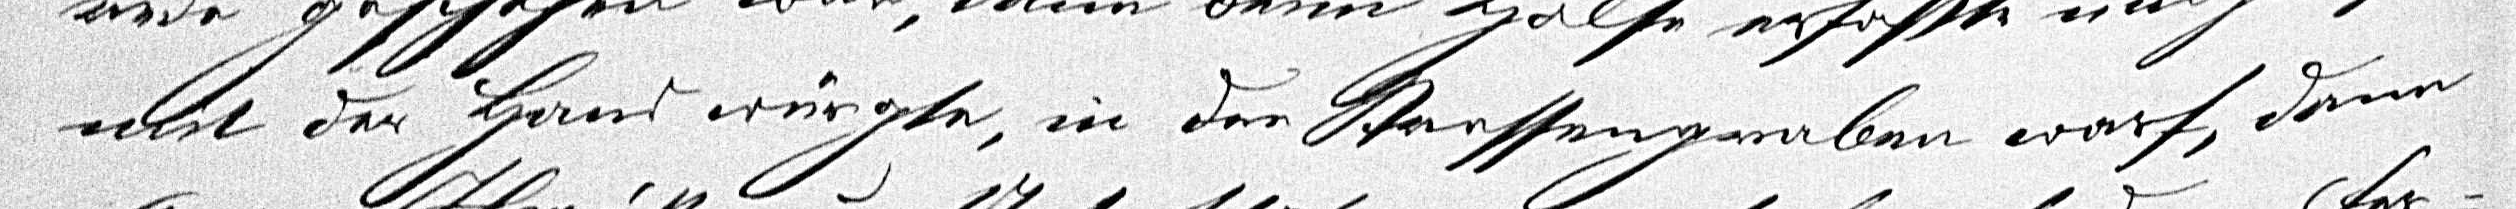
mit der Hand würgte, in den Strassengraben warf, dann
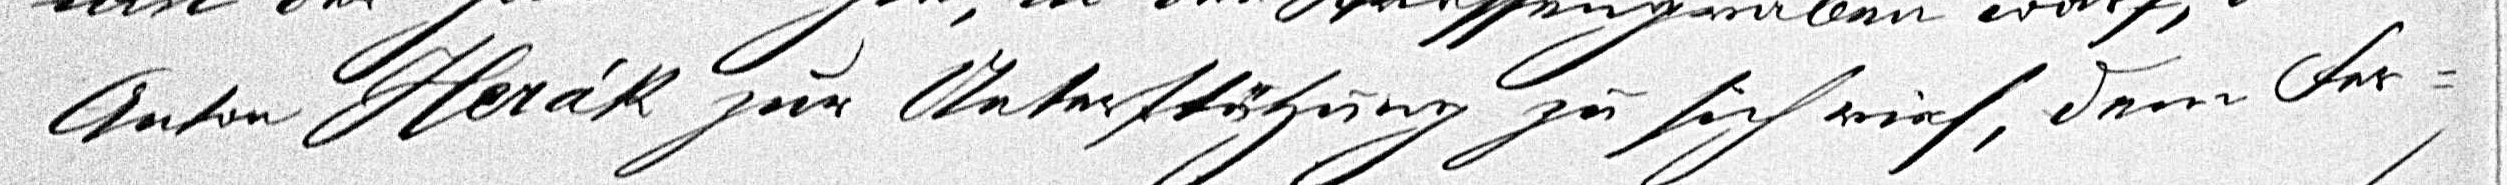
Anton Herák zur Unterstützung zu sich rief, dem Fer¬
